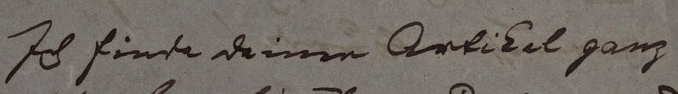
Ich finde Deinen Artikel ganz
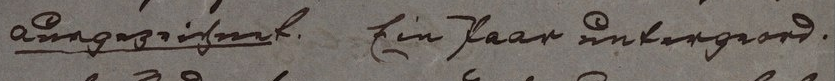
ausgezeichnet. Ein Paar untergeord-
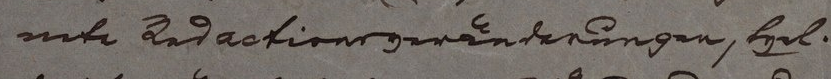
nete Redactionsveränderungen, wel-
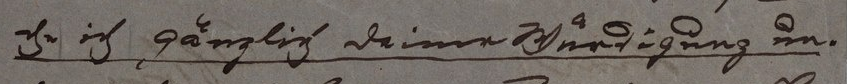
che ich gänzlich Deiner Würdigung un-
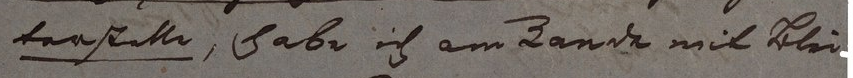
terstelle, habe ich am Rande mit Blei-
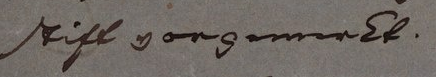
stift vorgemerkt.
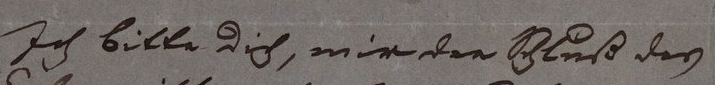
Ich bitte Dich, mir den Schluß des
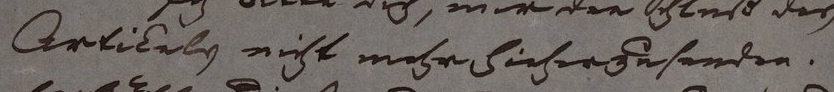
Artikels nicht mehr hieherzusenden.
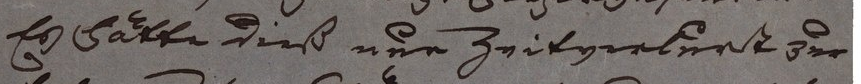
Es hätte dieß nur Zeitverlurst zur
